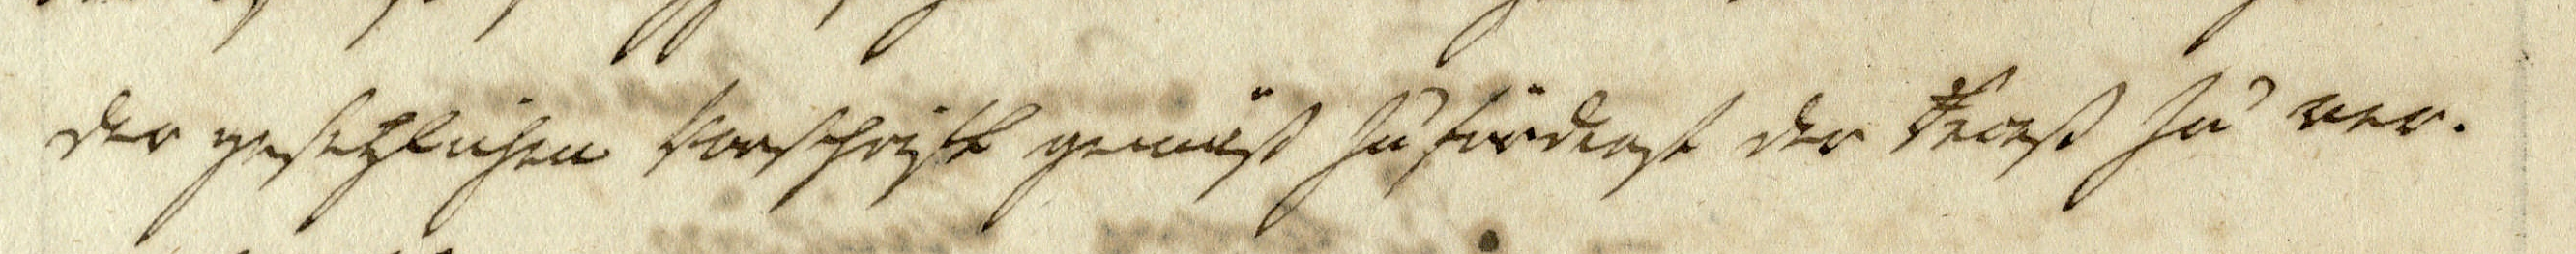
der gesetzlichen Vorschrift gemäß zuförderst der Receß zu ver¬
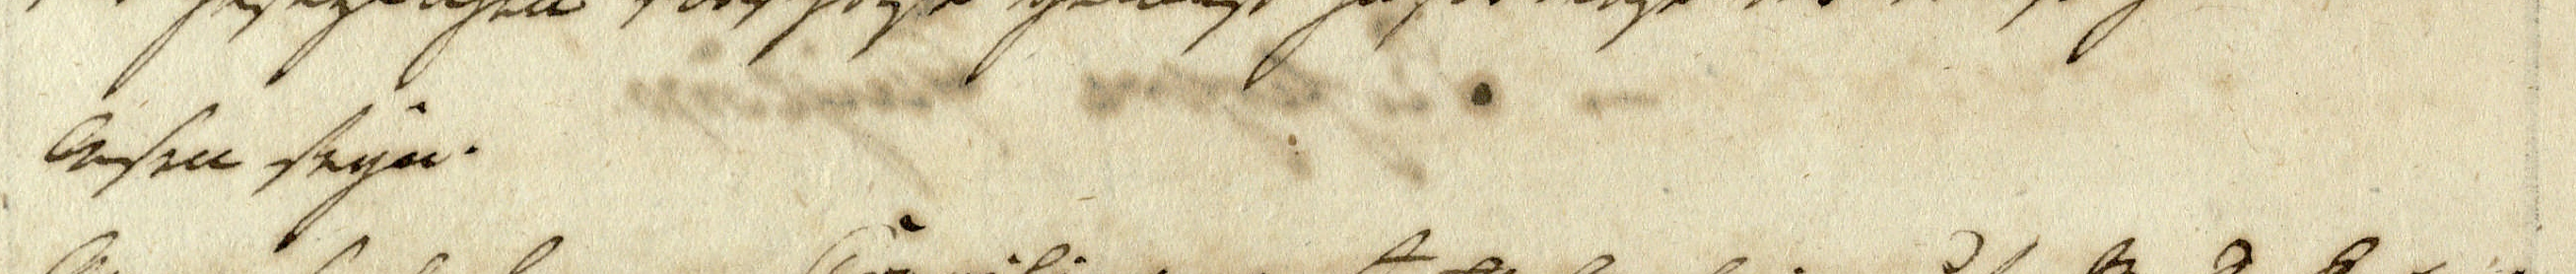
lesen seÿn.
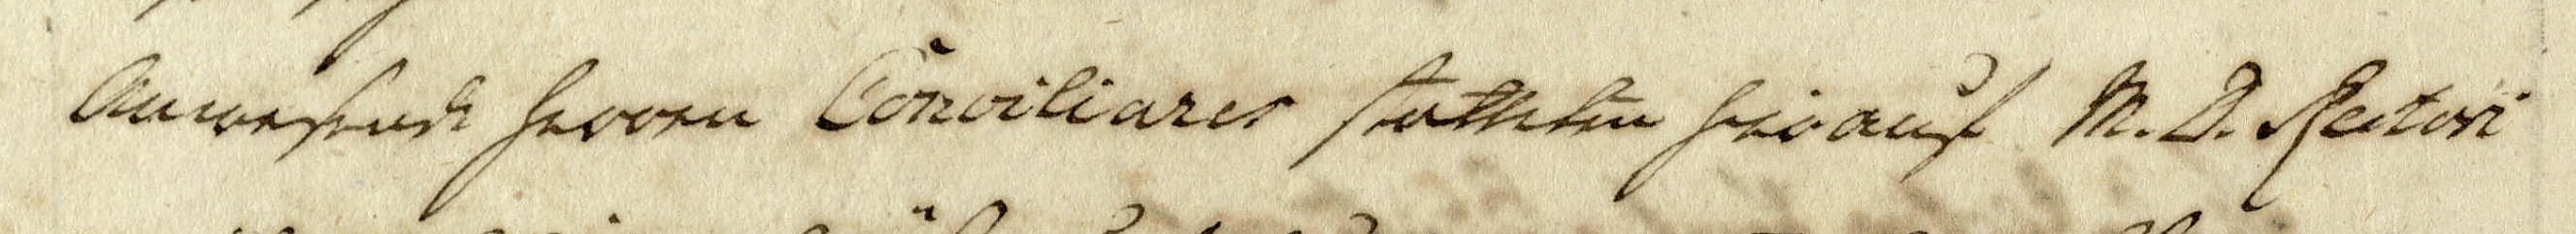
Anwesende Herren Conciliares statteten hierauf M. D. Rectori
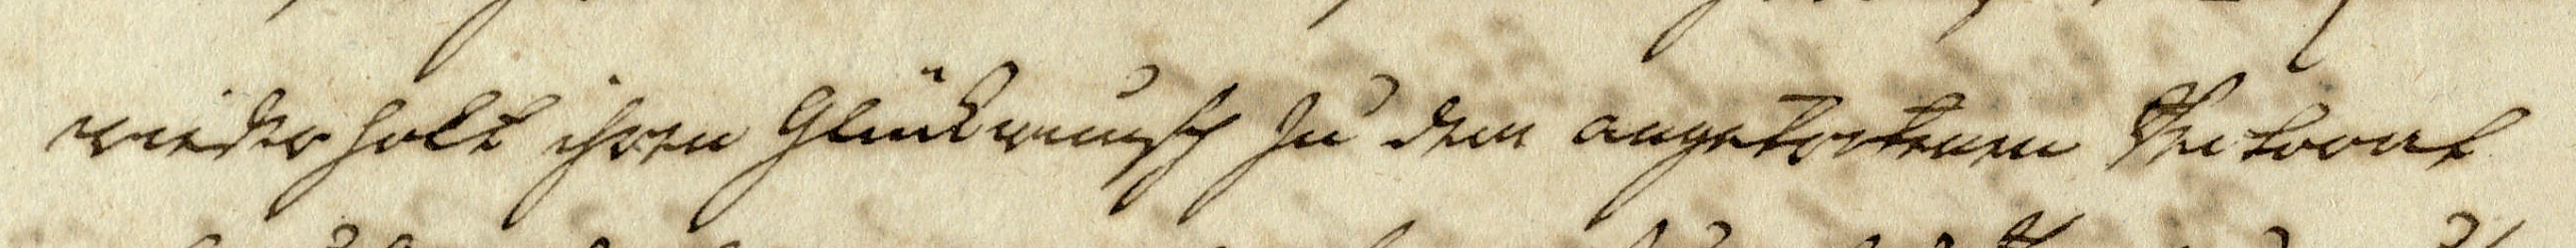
wiederholt ihren Glückwunsch zu dem angetretenen Rectorat
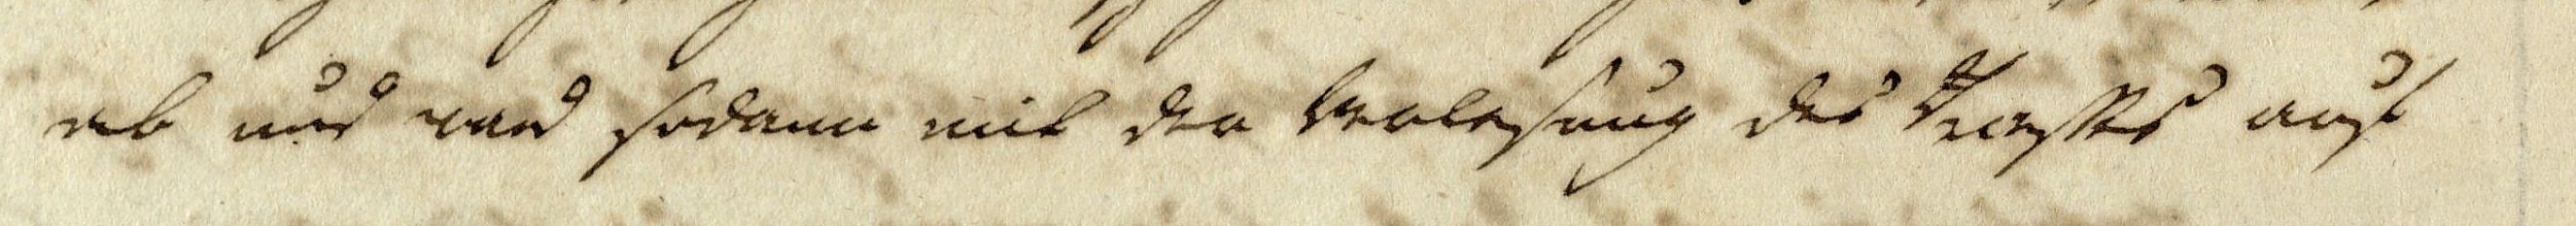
ab und ward sodann mit der Verlesung des Recesses auf
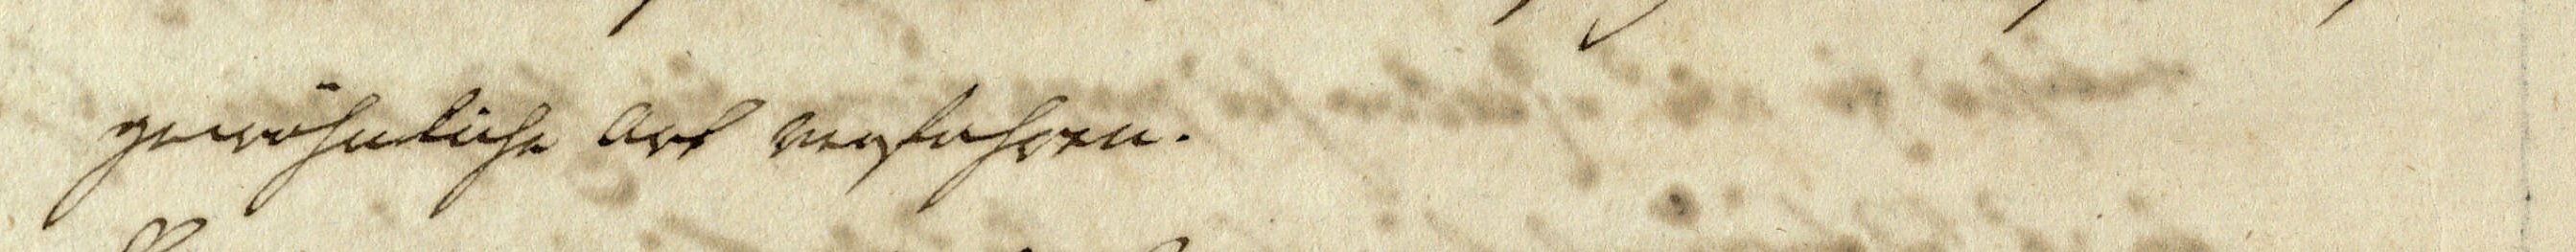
gewöhnliche Art verfahren.
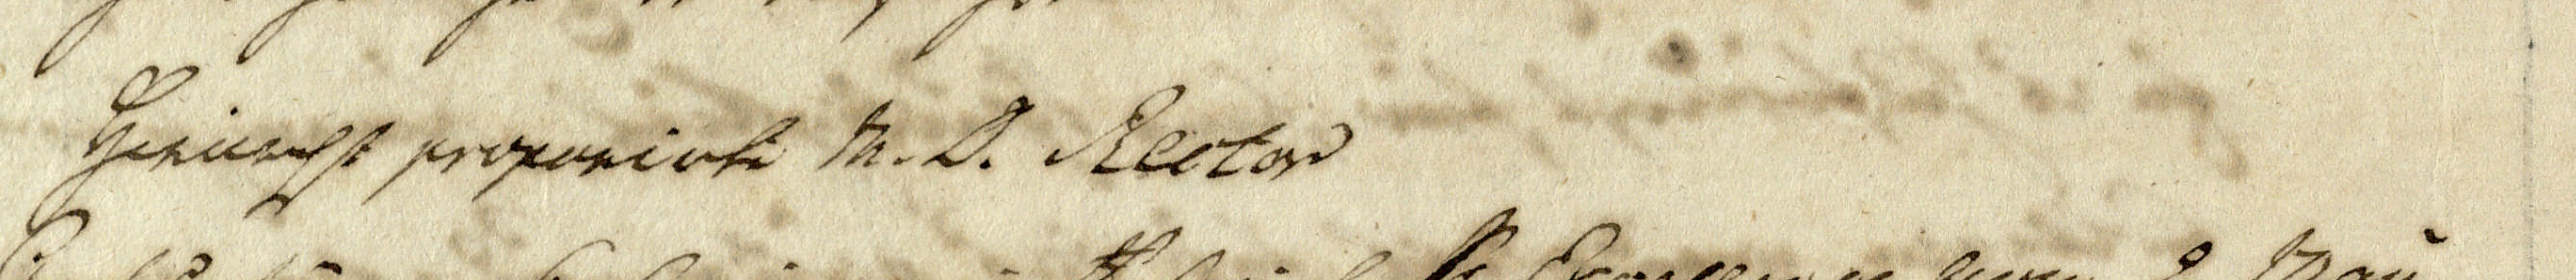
Hienechst proponirte M. D. Rector
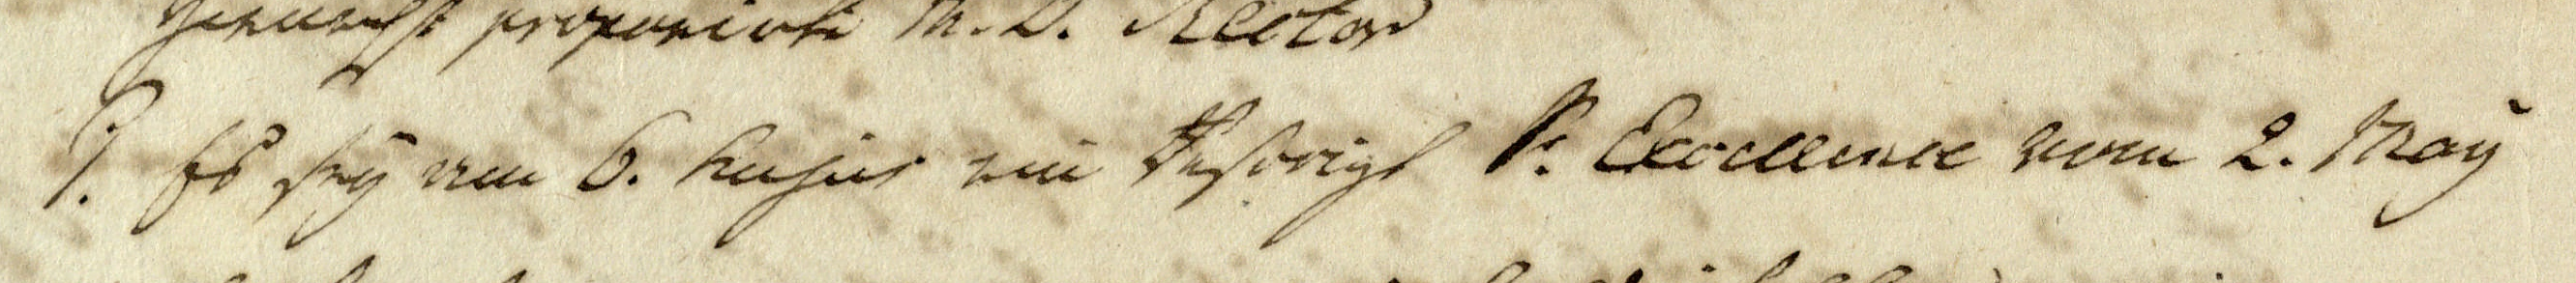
1. Es seÿ am 6. hujus ein Rescript Sr Excellence vom 2. Maÿ
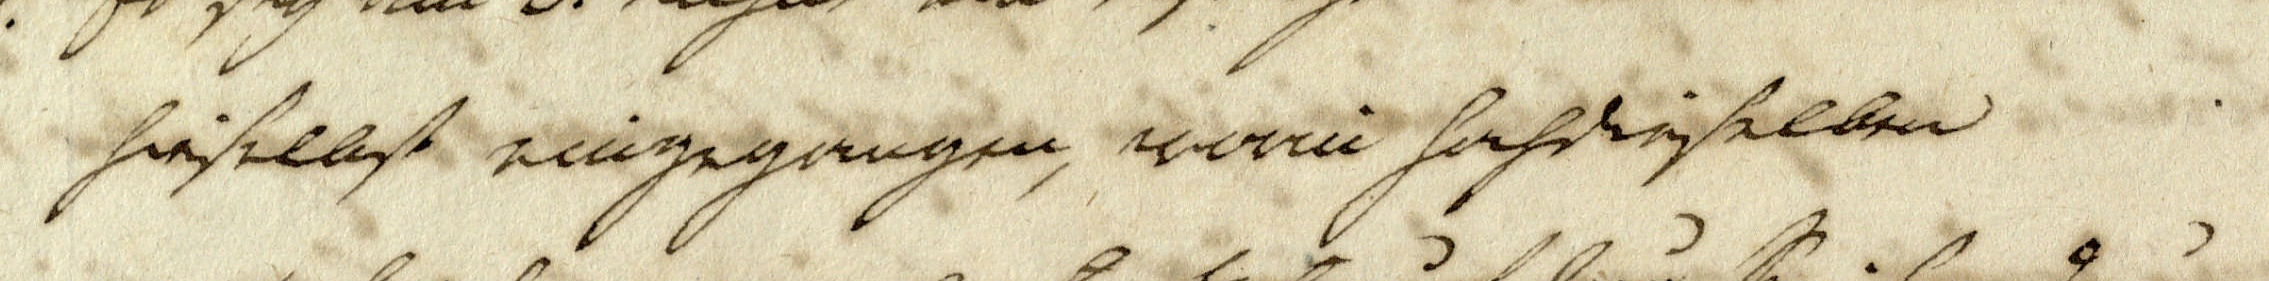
hieselbst eingegangen, worin Hochdieselben
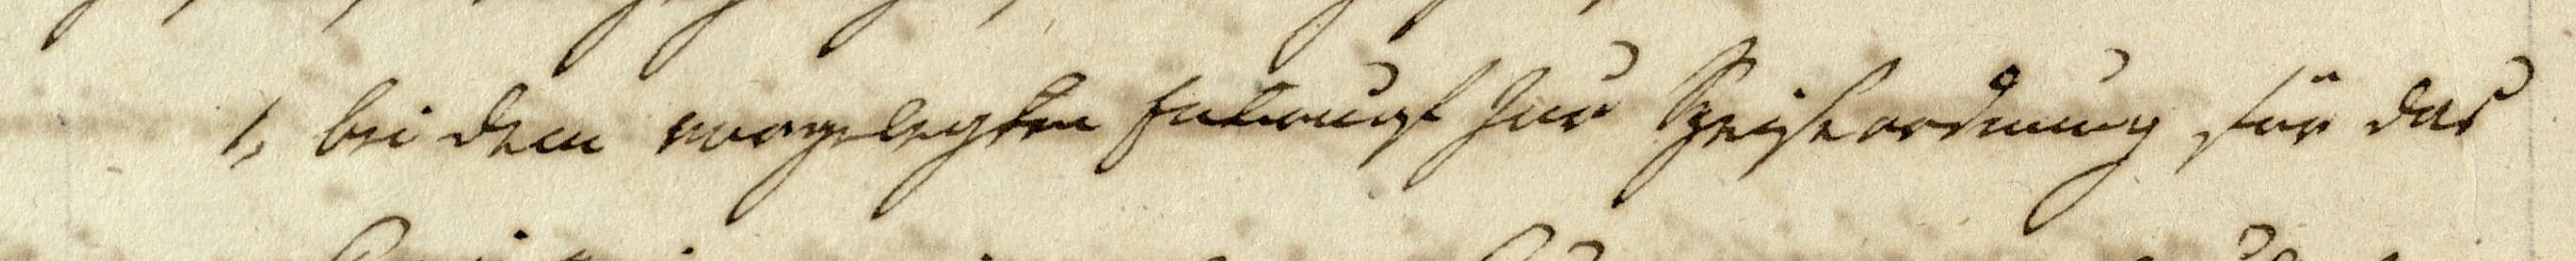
1, bei dem vorgelegten Entwurf zur Speiseordnung für das
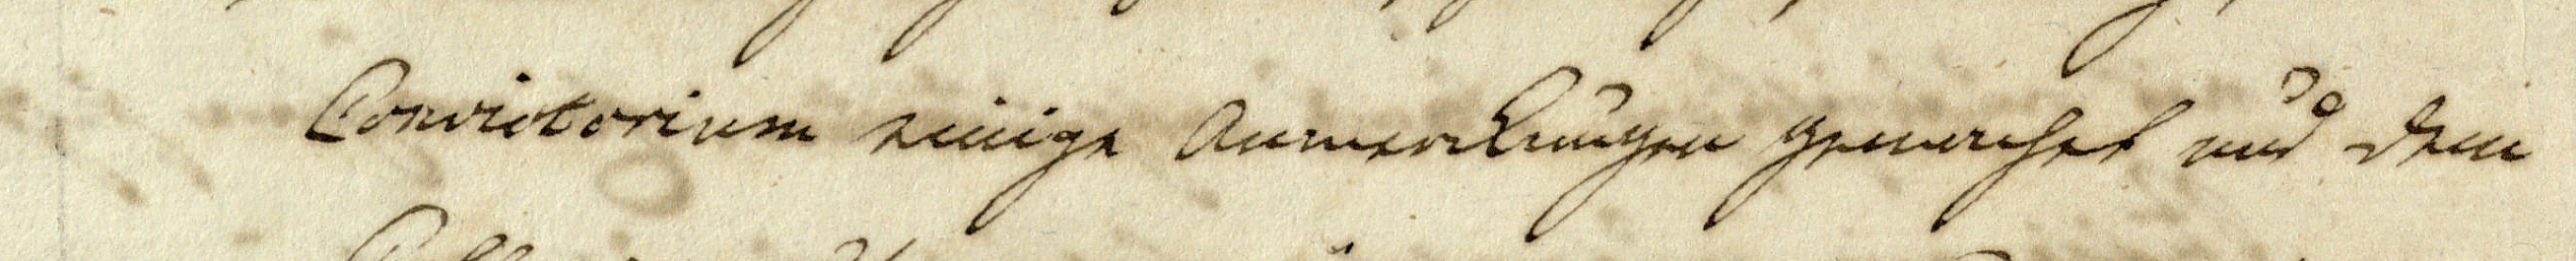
Convictorium einige Anmerckungen gemachet und dem
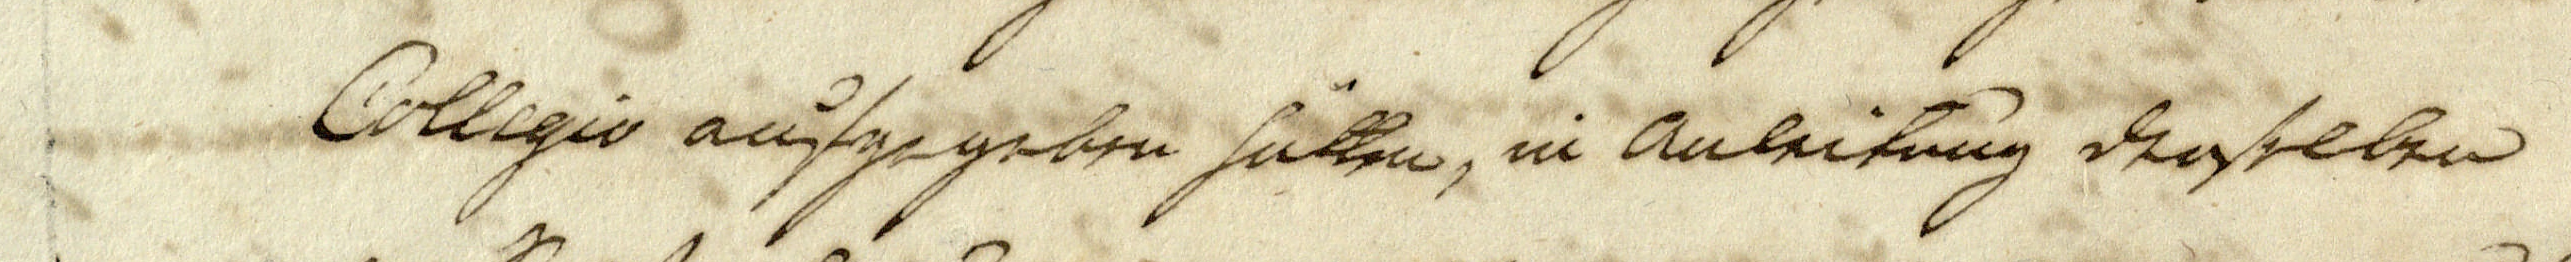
Collegio aufgegeben hätten, in Anleitung derselben
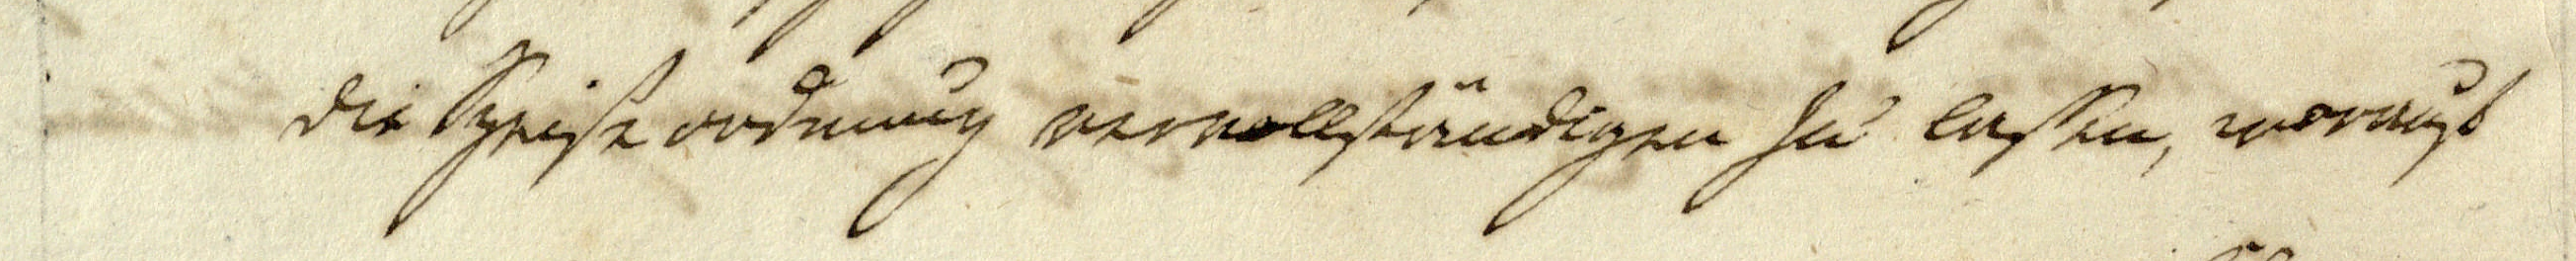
die Speiseordnung vervollständigen zu lassen, worauf
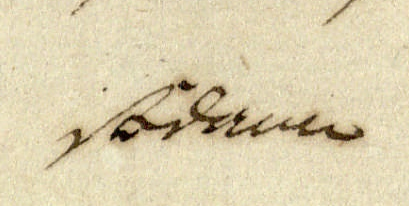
sodann
